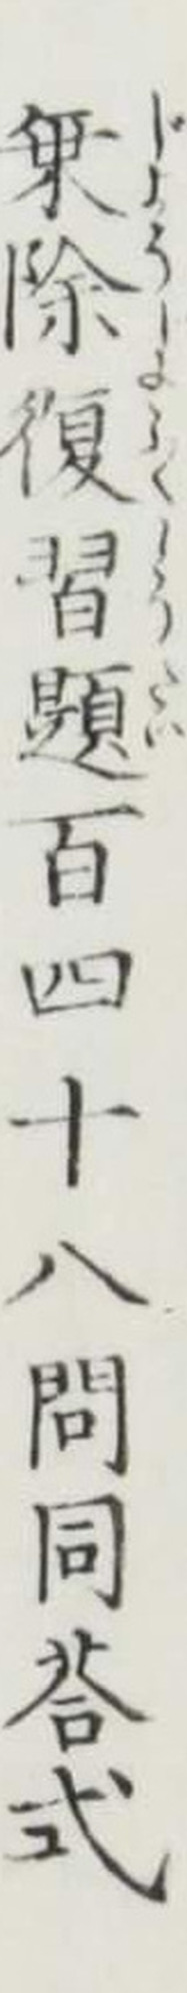乗除復習題百四十八問同答式
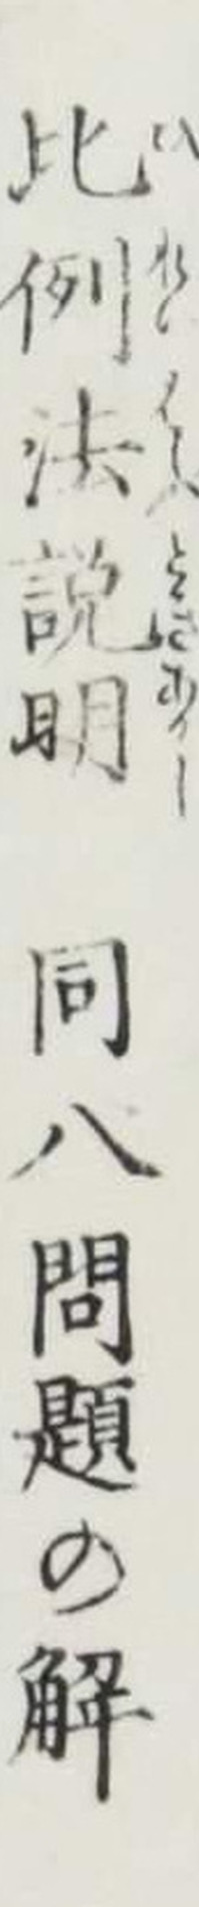此例法説明同八問題の解
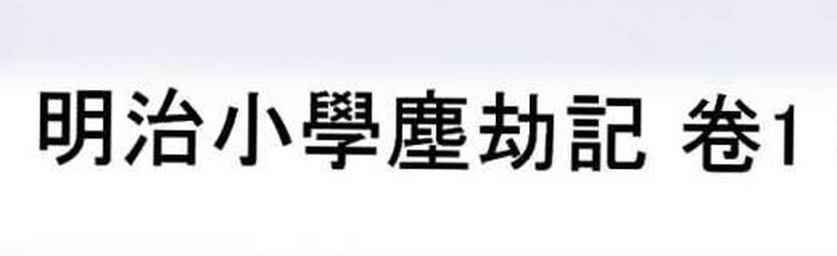明治小学塵劫記
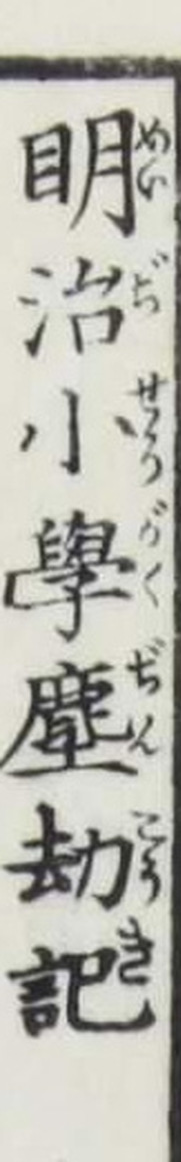明治小学塵劫記
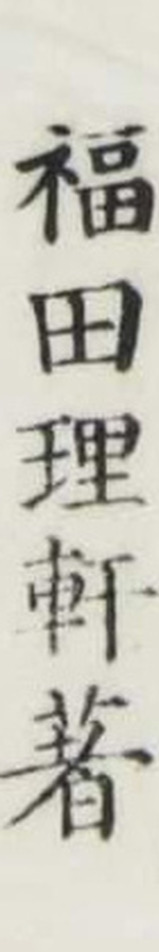福田理軒著
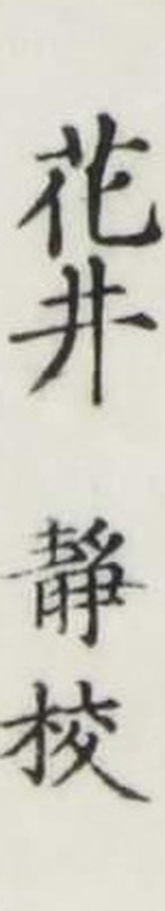花井静校
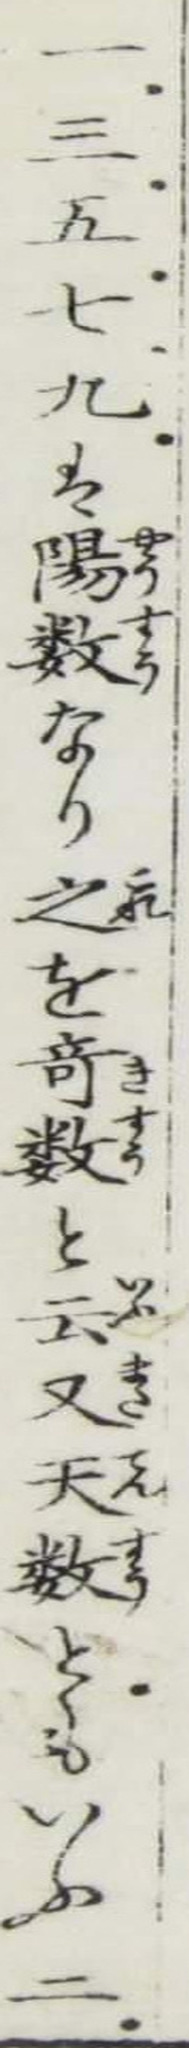一．三．五．七．九．は陽数なり之を奇数と云又天数ともいふ二．
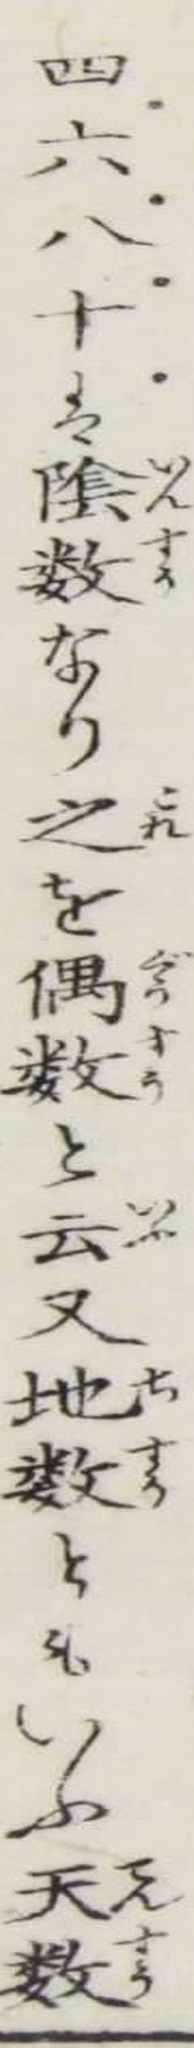四．六．八．十．は陰数なり之を偶数と云又地数ともいふ天数
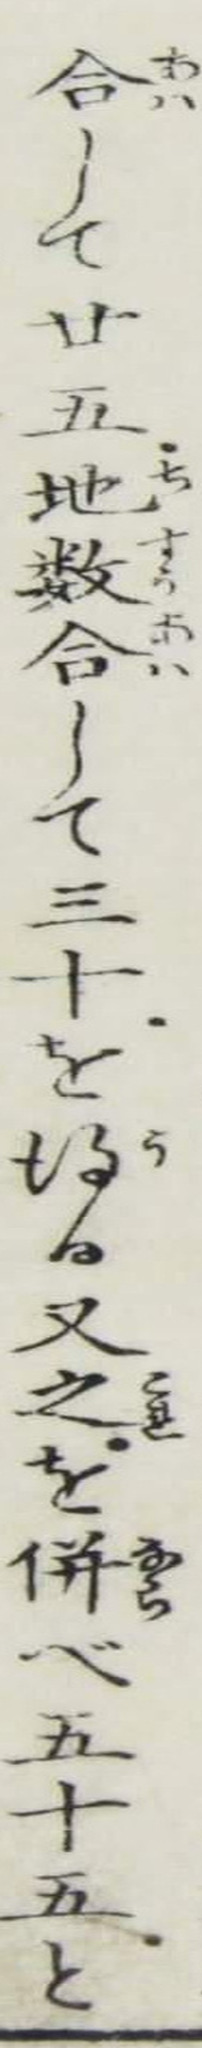合して廿五．地数合して三十．を得る又之．を併べ五十五．と
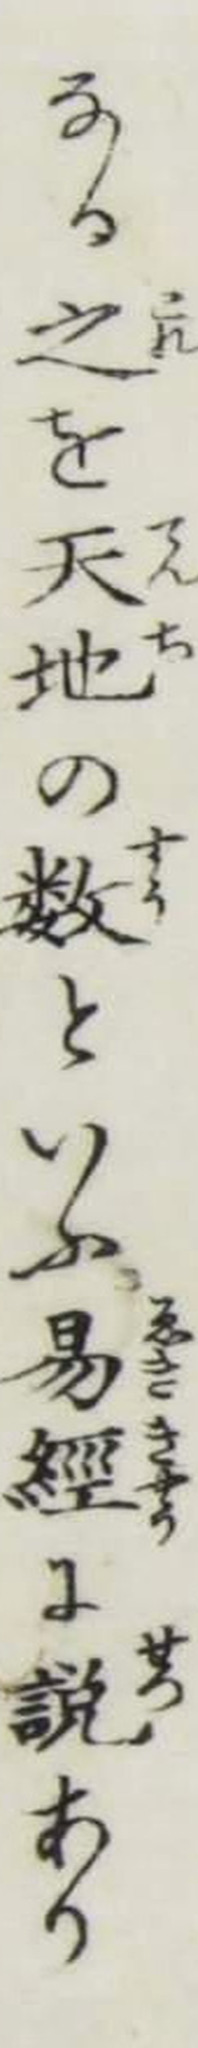なる之を天地の数といふ易経に説あり
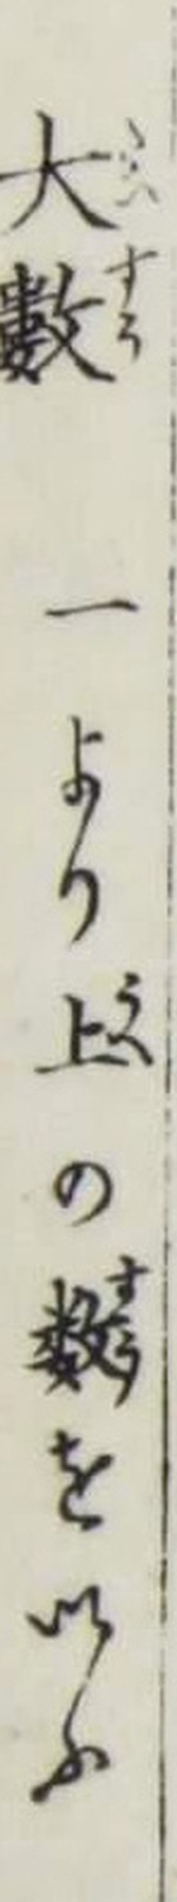大数一より上の数をいふ
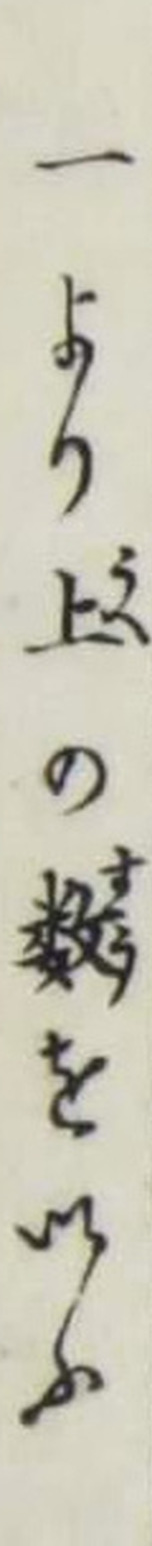大数一より上の数をいふ

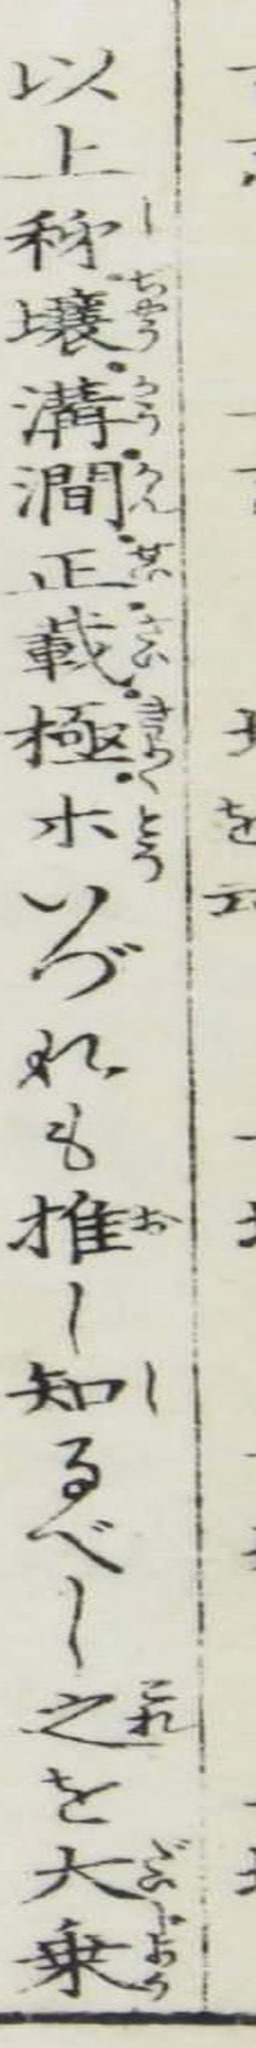以上秭．壌．溝．澗．正．載．極．等いづれも推し知るべし之を大乗
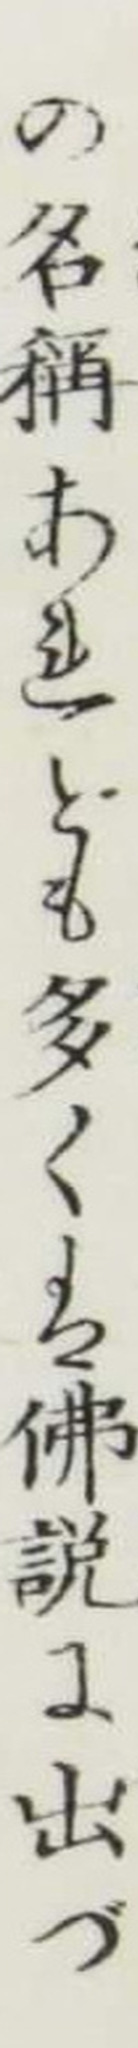の名称あれども多くは仏説に出づ
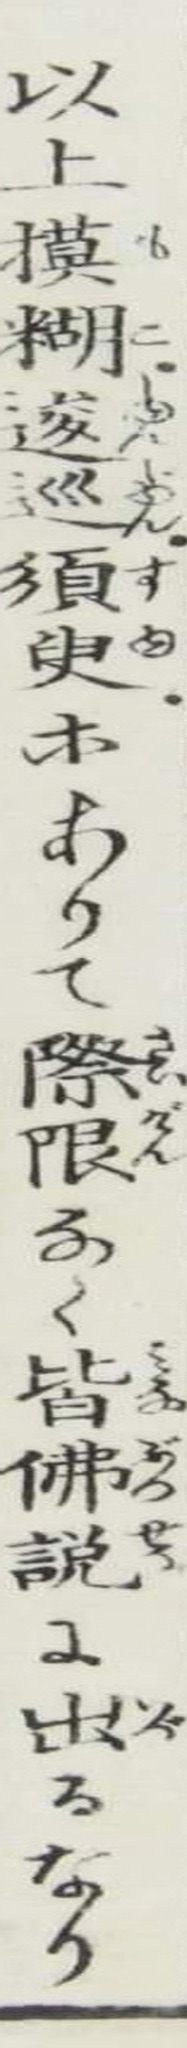以上摸糊．逡巡．須臾等ありて際限なく皆仏説に出るなり
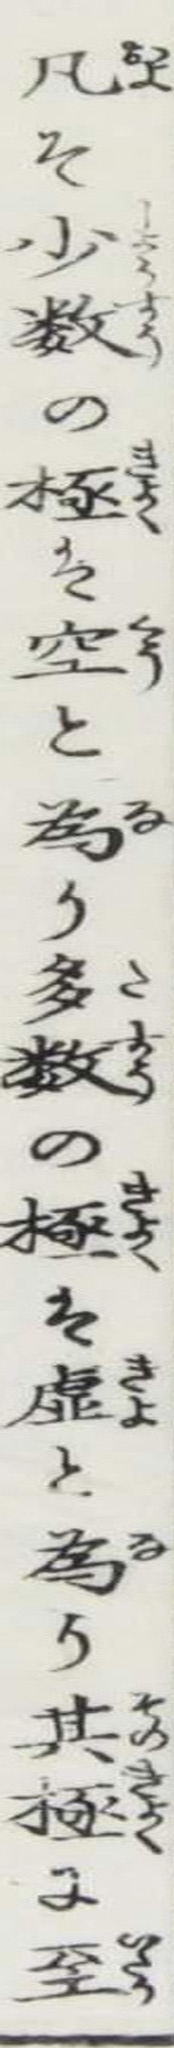凡そ少数の極は空と為り多数の極は虚と為り其極に至
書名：明治小學塵劫記 卷1
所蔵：東京学芸大学教育コンテンツアーカイブ
